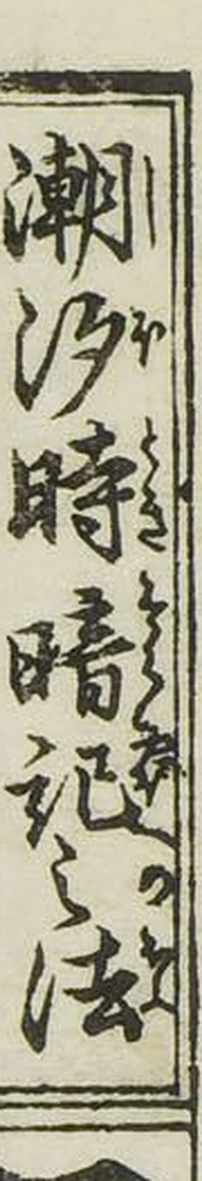潮汐暗記之法
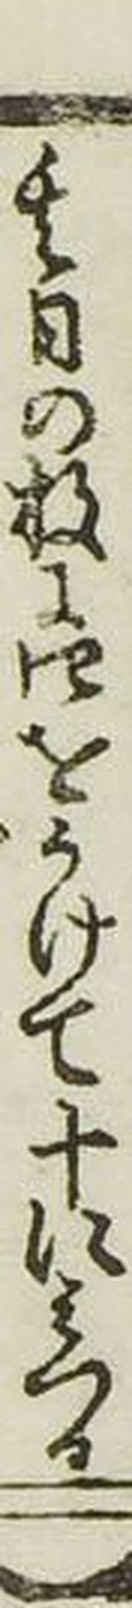其日の数に四をかけて十にみつる
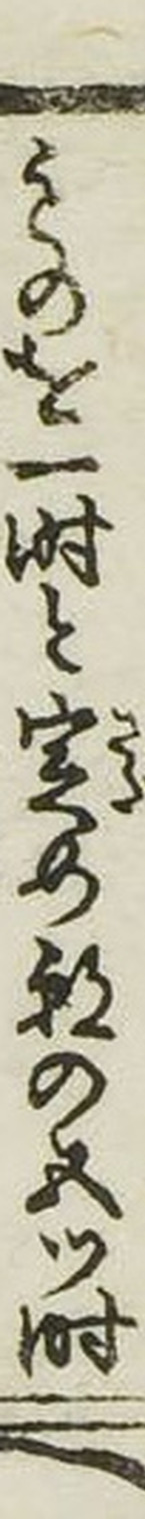ものを一時と定め朝の五ツ時
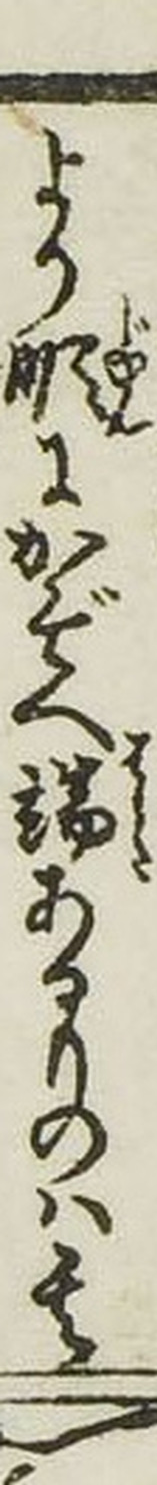より順にかぞへ端あるものは其
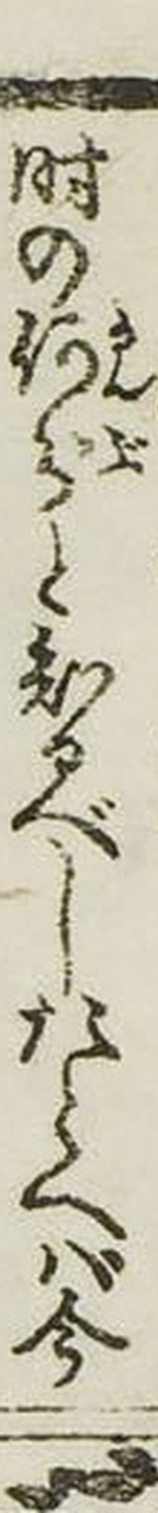時の何分と知るべしたとへば今
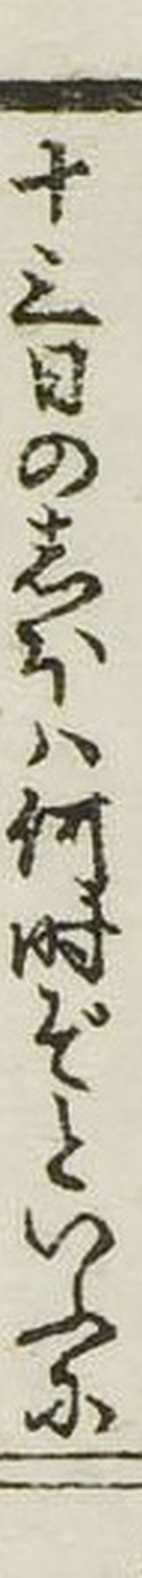十三日のしほは何時ぞといふに
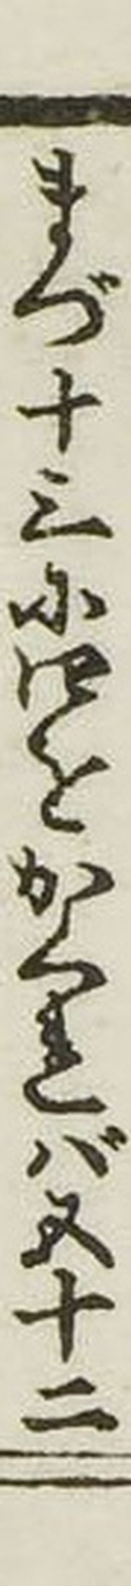まづ十三に四をかくれば五十二
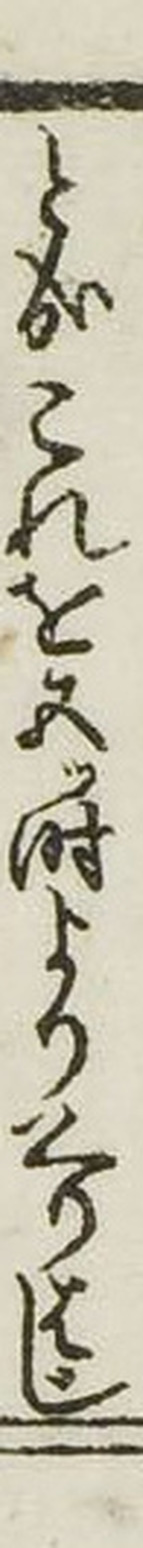と成これを五ッ時よりくりはじ
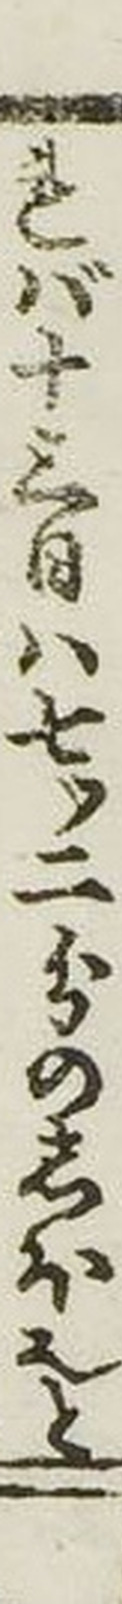れば十三日は七ッ二分のしほ也と
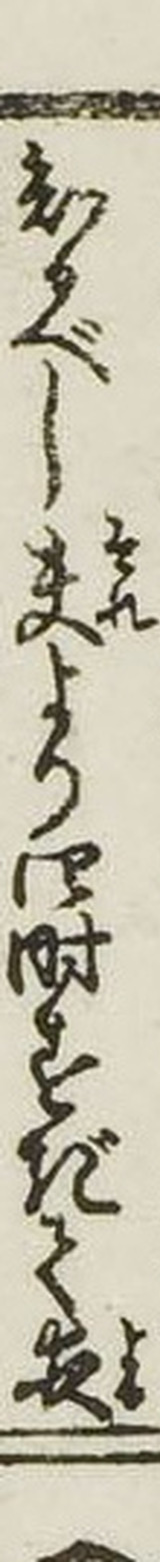知るべし夫より四時すぎて夜
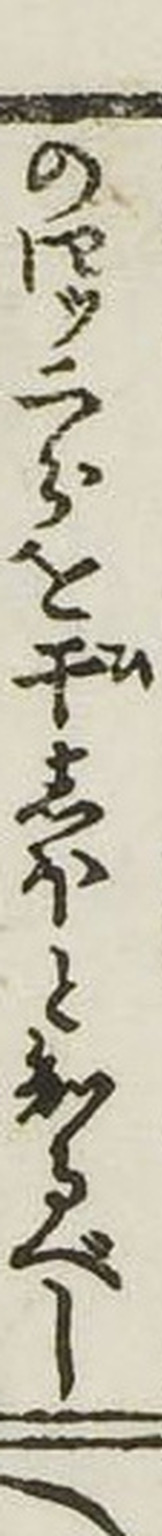の四ッ二分を干しほと知るべし
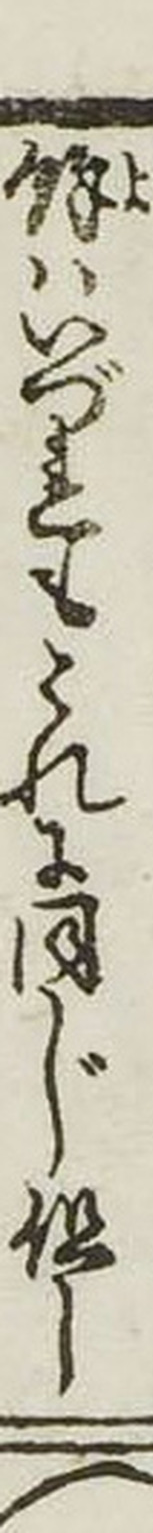余はいづれもこれに同じ但し
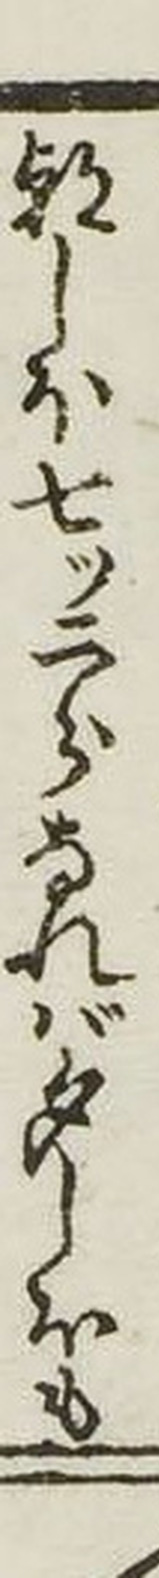朝しほ七ッ二分なれば夕しほも
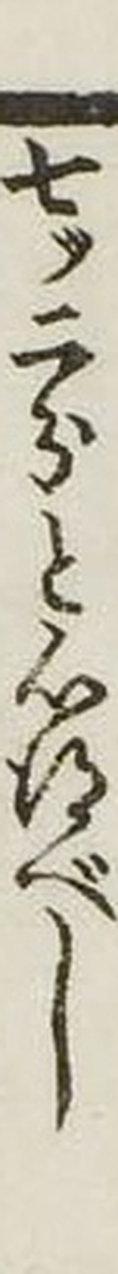七ッ二分と心得べし
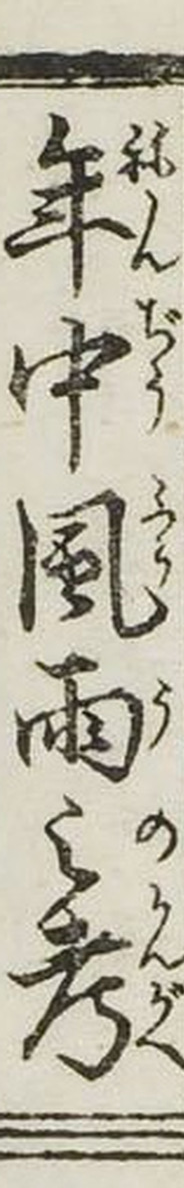年中風雨之考
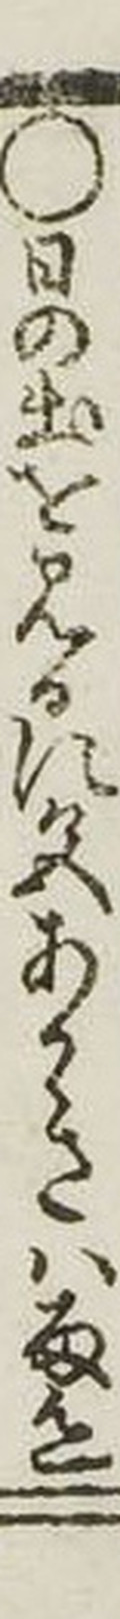○日の出を見るに色あかきは雨色
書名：商人書翰便覧
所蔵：東京学芸大学教育コンテンツアーカイブ
